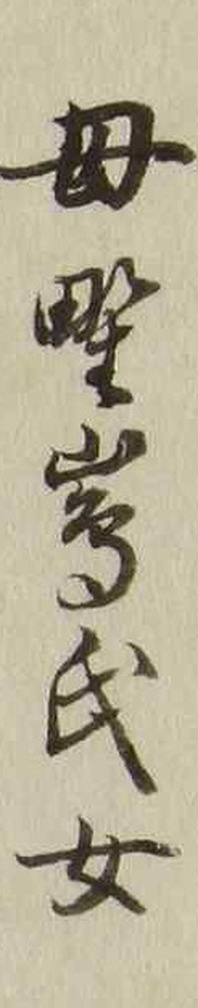母野島氏女
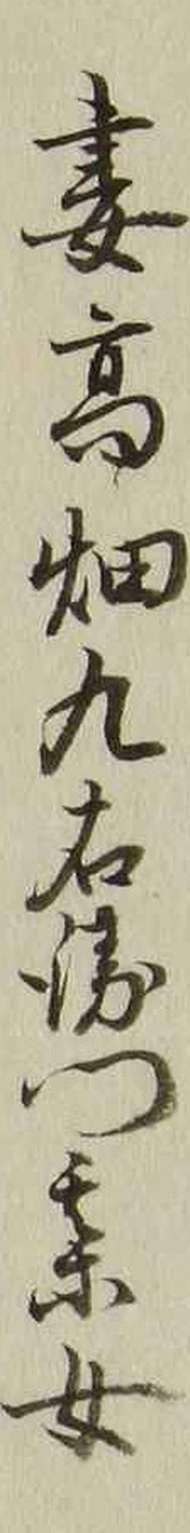妻高畑九右衛門某女
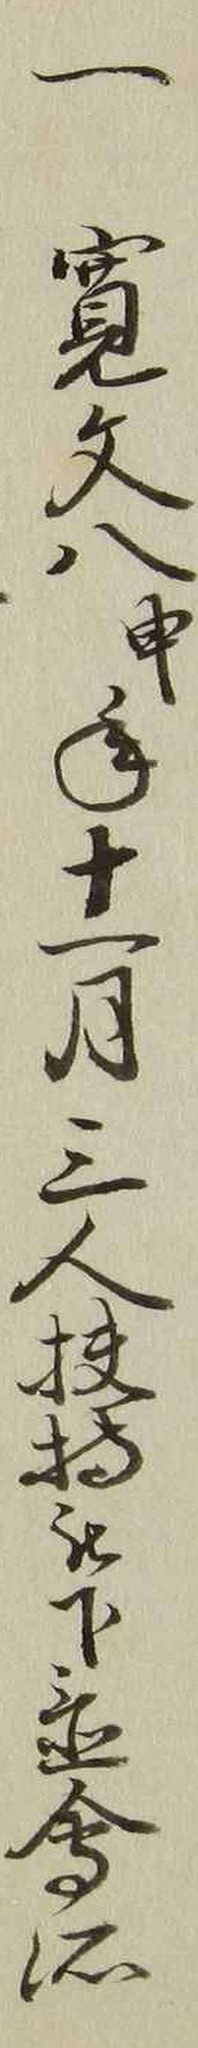一寛文八申年十一月三人扶持被下置会所
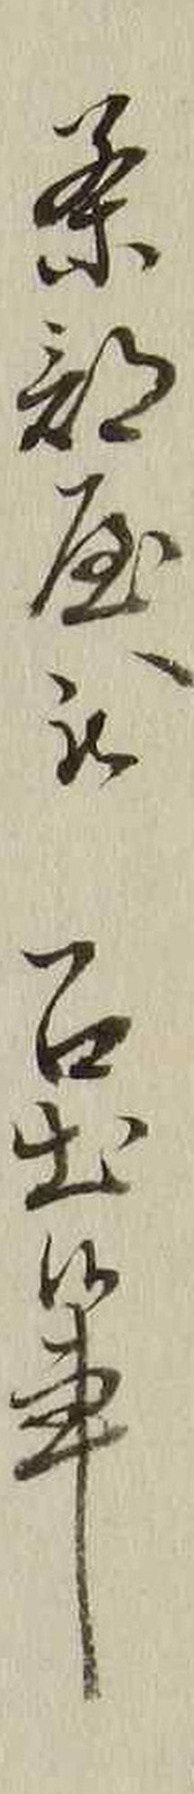茶部屋へ被召出候事
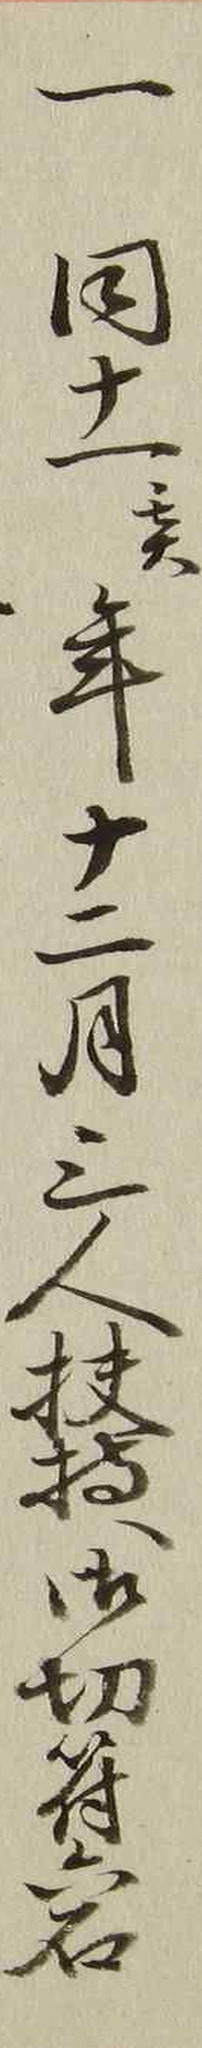一同十一亥年十二月三人扶持へ御切符六石
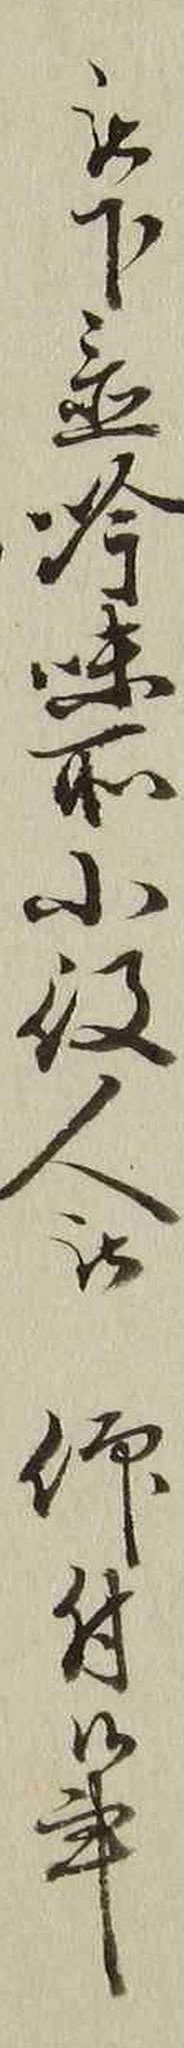被下置吟味所小役人被仰付候事
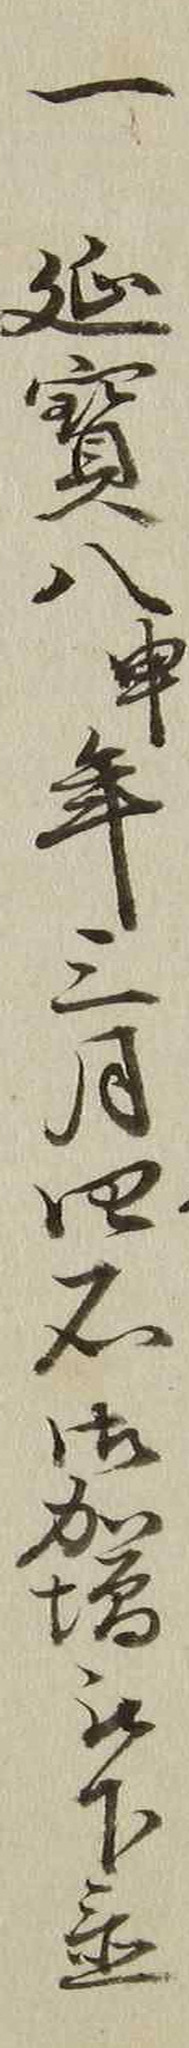一延宝八申年三月四石御加増被下置
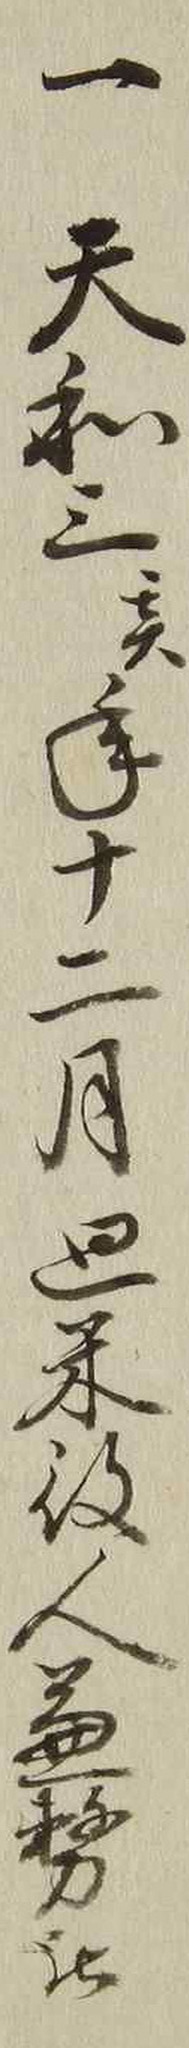一天和三亥年十二月廻米役人兼務被
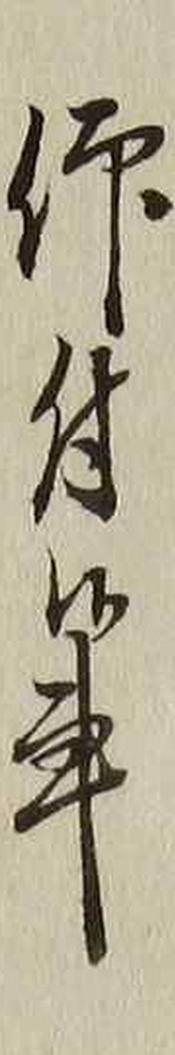仰付候事
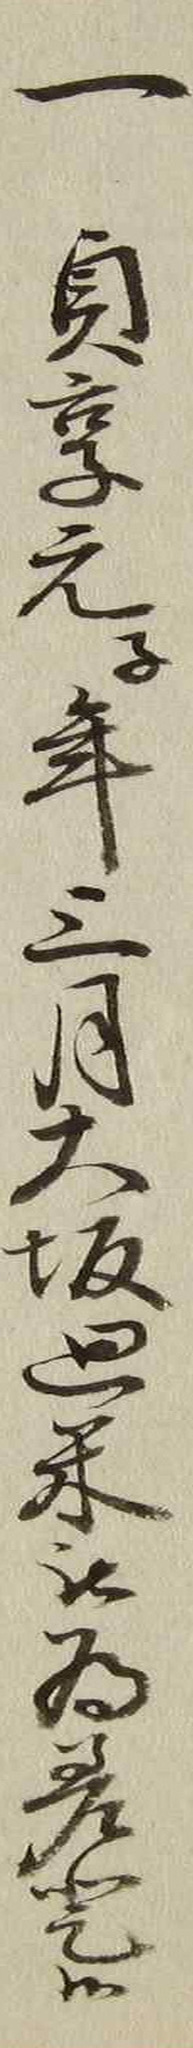一貞享元子年三月大坂廻米被為差登候
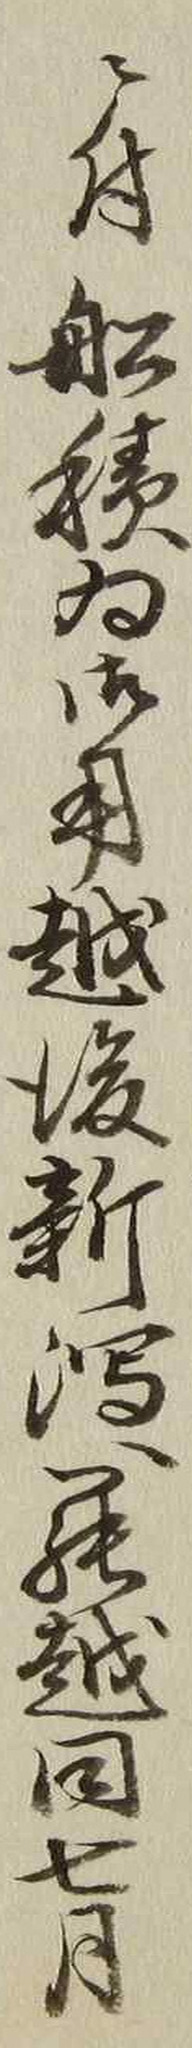ニ付船積為御用越後新潟へ罷越同七月
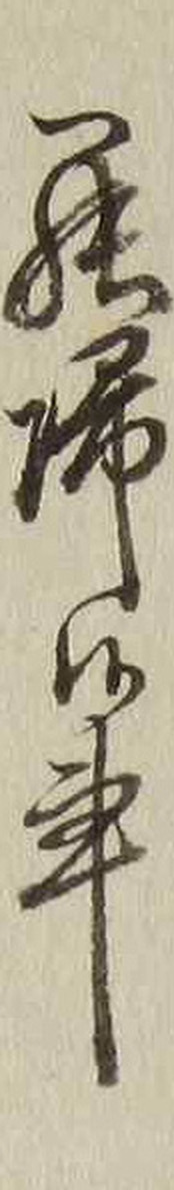罷帰候事
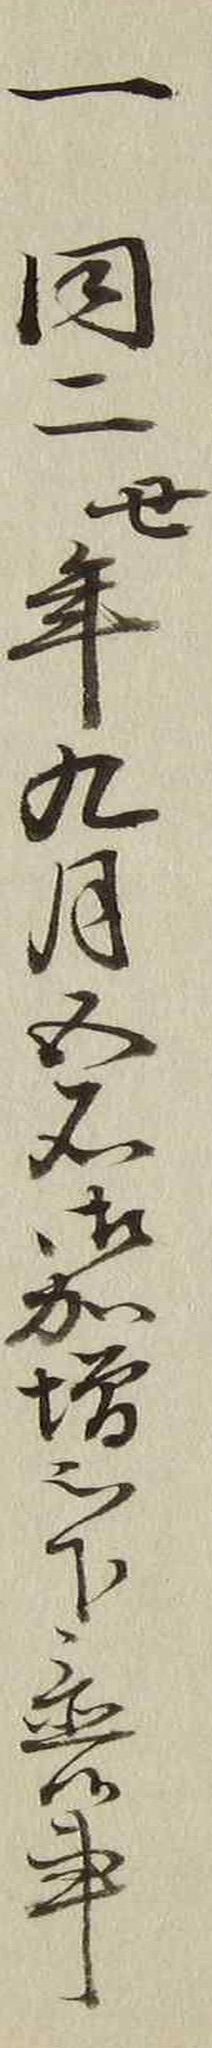一同二丑年九月五石御加増被下置候事
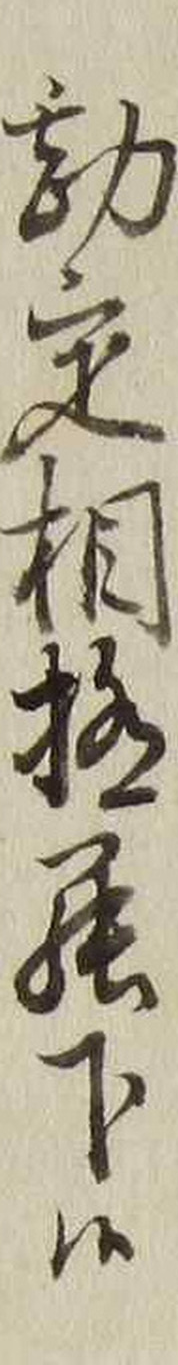勘定相極罷下候
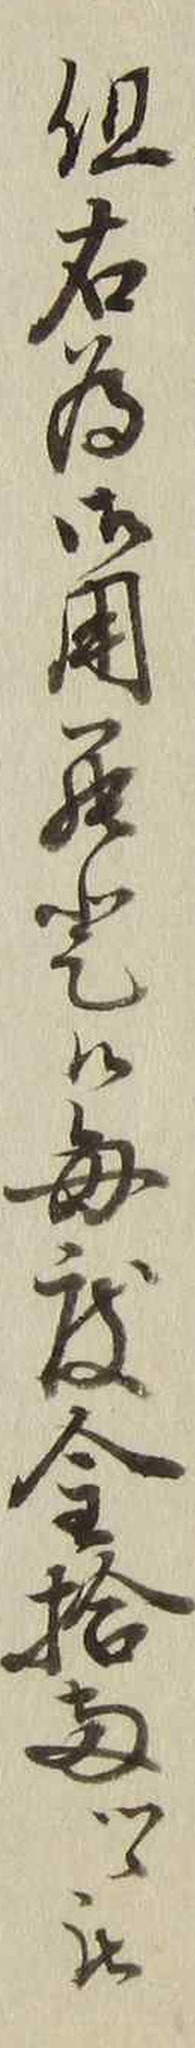但右為御用罷登侯毎度金拾両ツヽ被
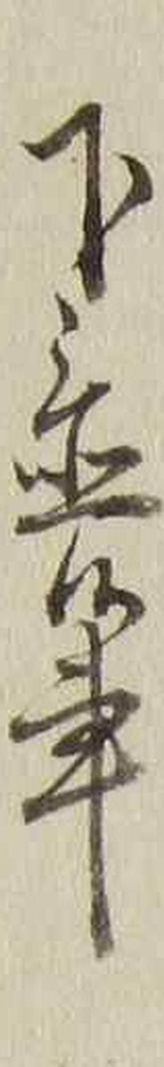下置候事
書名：諸士系譜　巻之27　い之部27
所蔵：会津若松市立会津図書館
